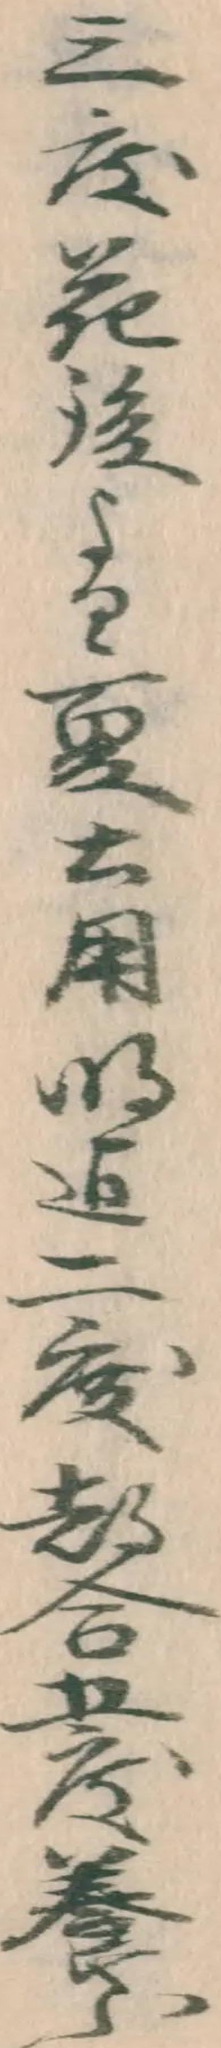三度花後より夏土用明迠二度都合五度養ふ
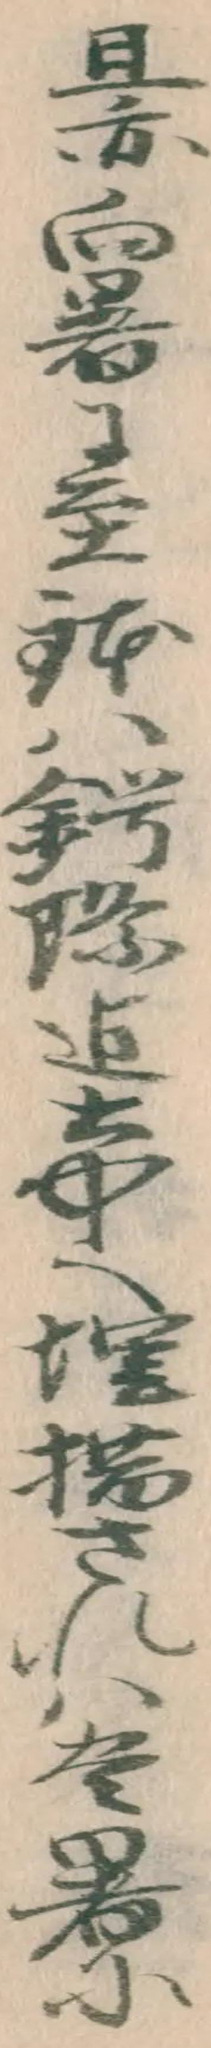且亦向暑に至鉢ハ鍔際迠土中へ埋措されハ炎暑に
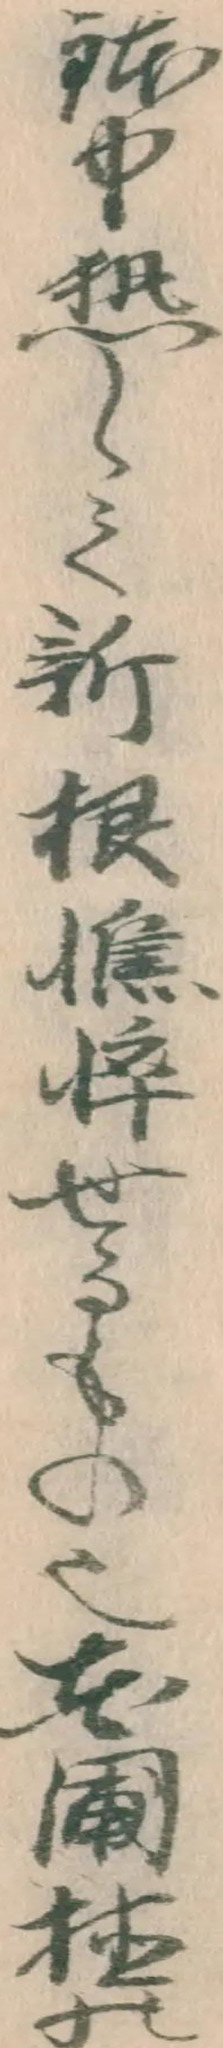鉢中熱して新根憔悴せるもの也花圃植の
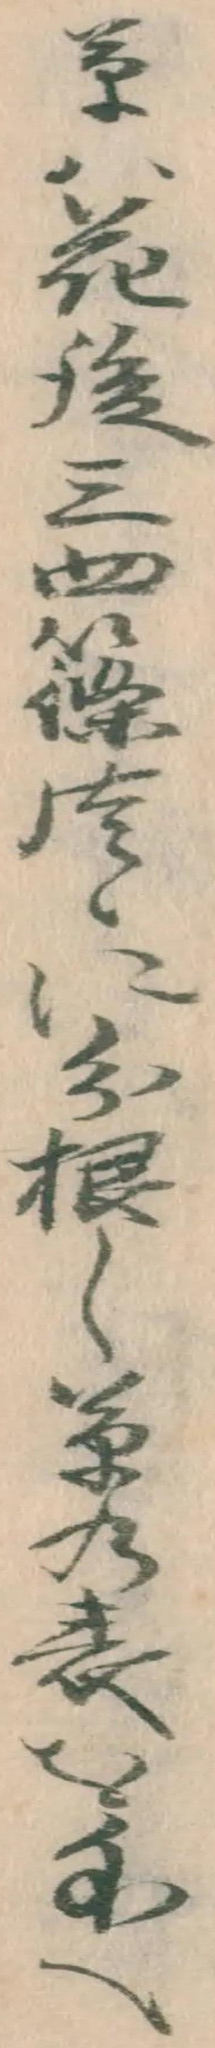草は花後三四篠片に分根し草の表を外へ

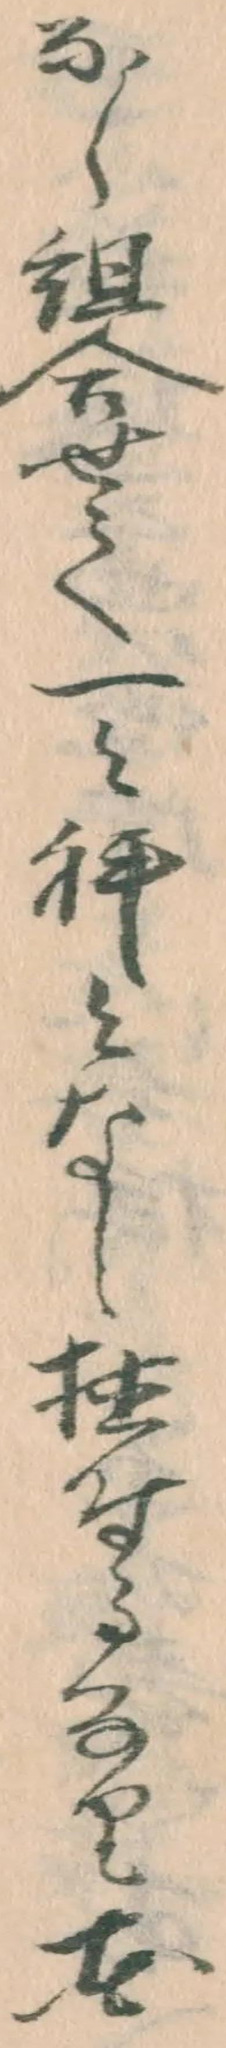なし組合せて一と科となし植付るなり花
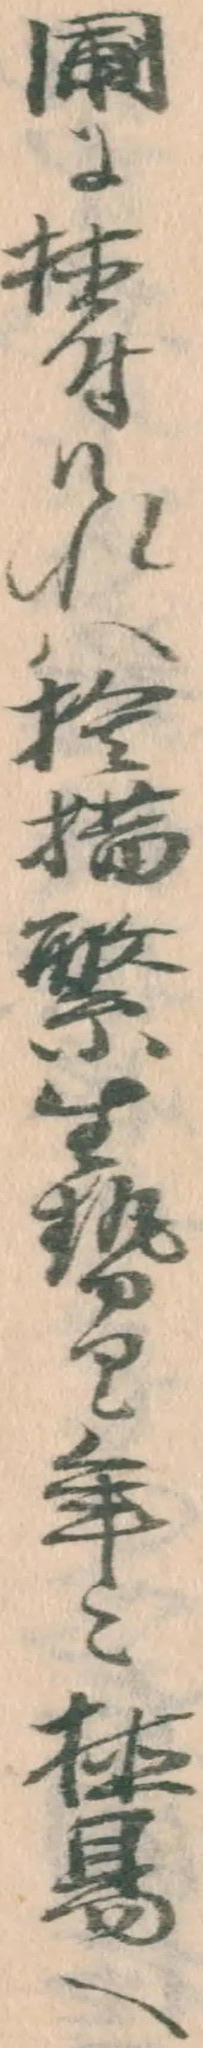圃に植付けれハ捨措繁生勢り年々植易へ
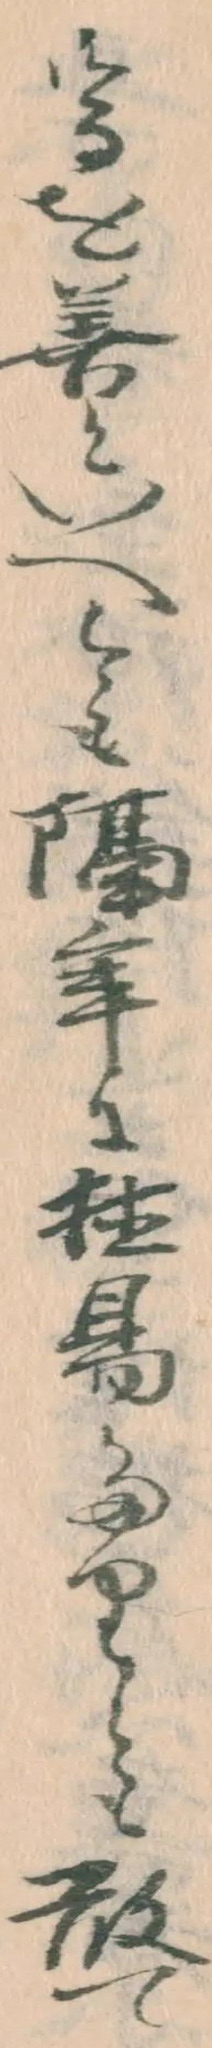するを善といへとも隔年に植易たりとも敢て
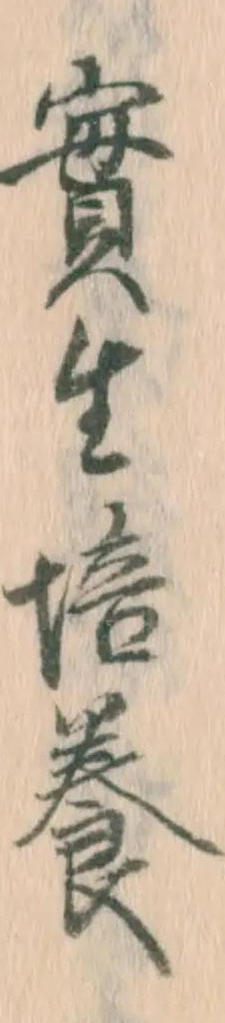実生培養
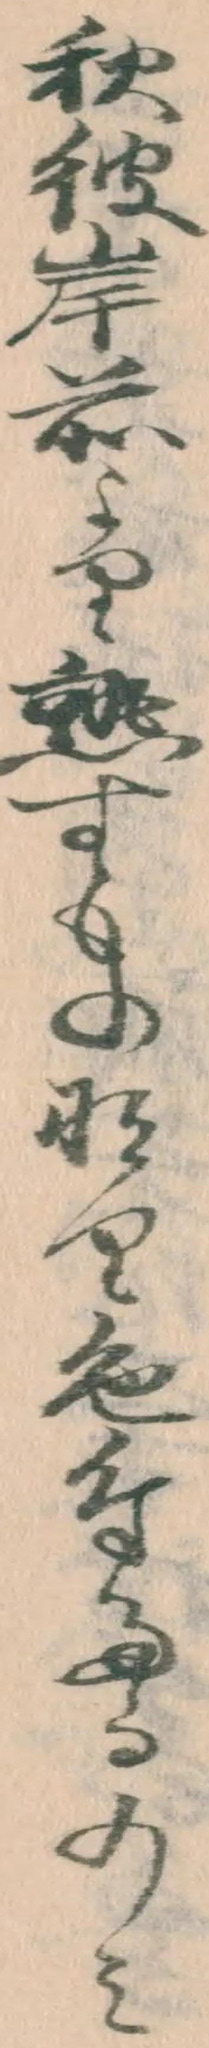秋彼岸前より熟すものなり色付たるのミ
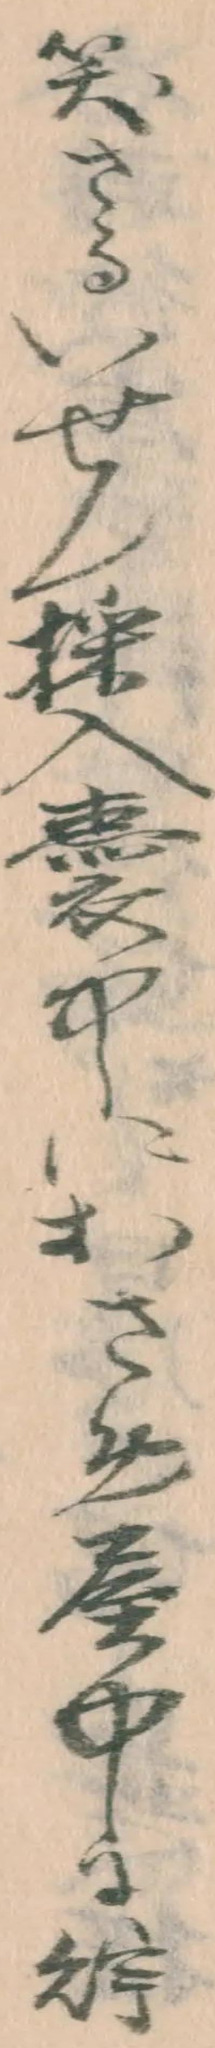笑さるいせん取入れ採入嚢中におさめ屋中に貯
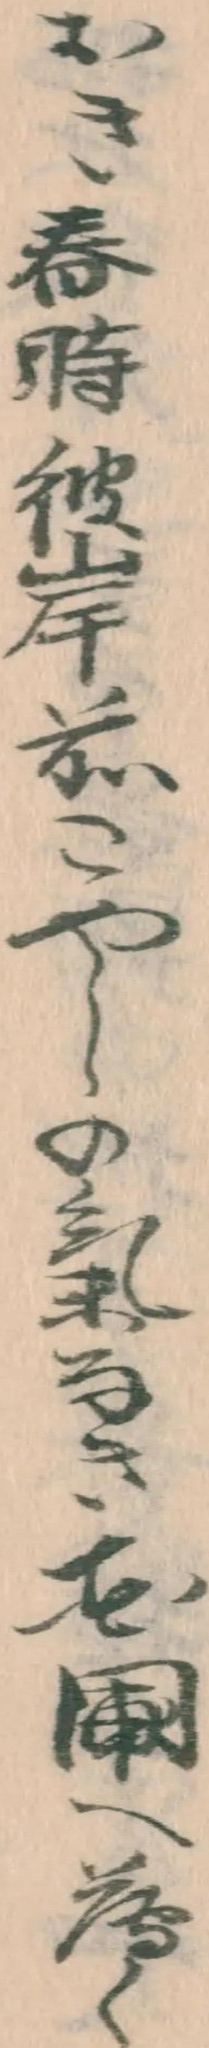おき春時彼岸前こやしの気なき花圃へ薄く
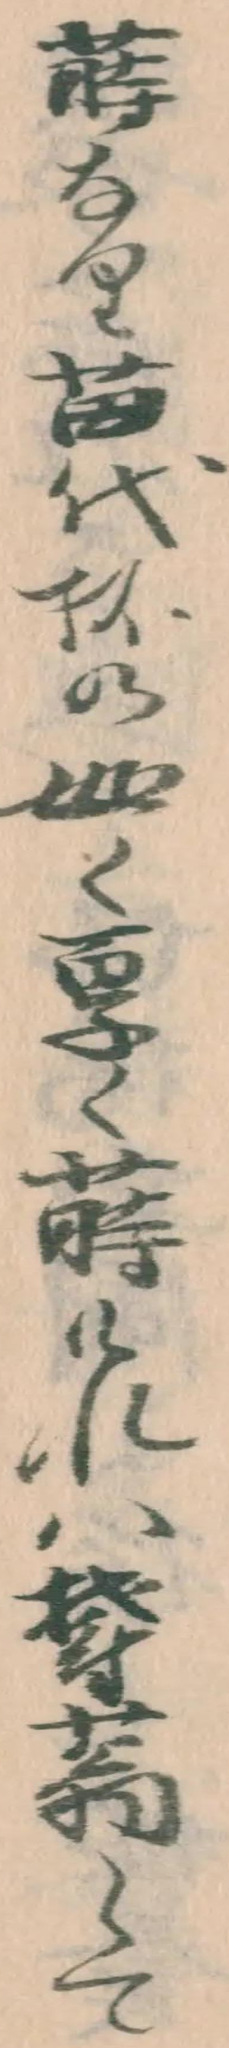蒔なり苗代抔の如く厚く蒔けれハ嵡して
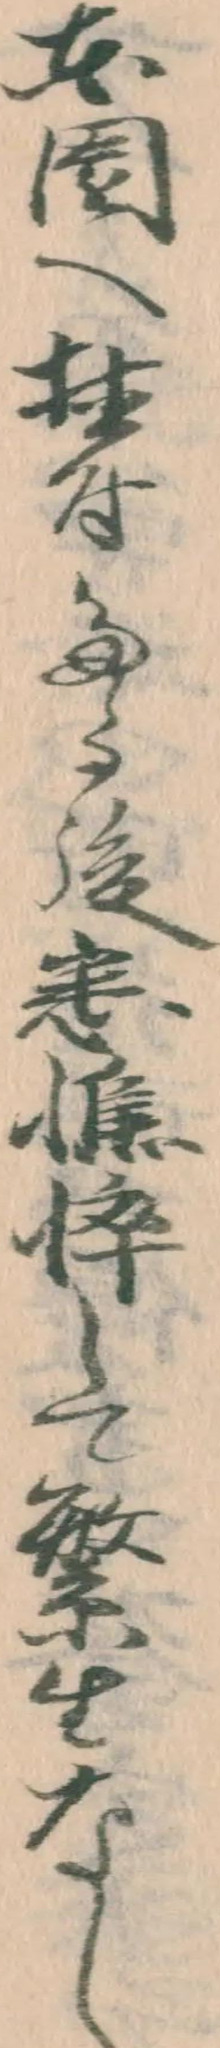花園へ植付たる後悉憔悴して繁生なし
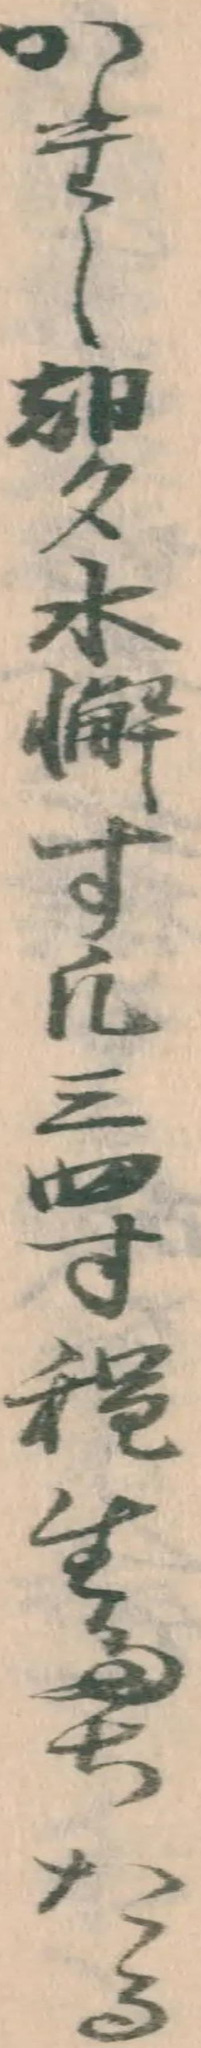かたし朝夕水懈す凡三四寸程生たちたる
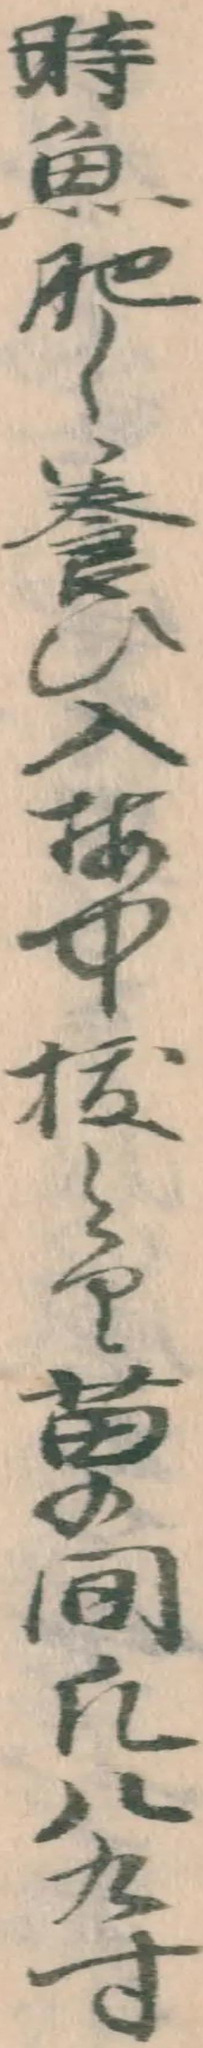時魚肥し養ひ入梅中抜とり苗の間凡八九寸
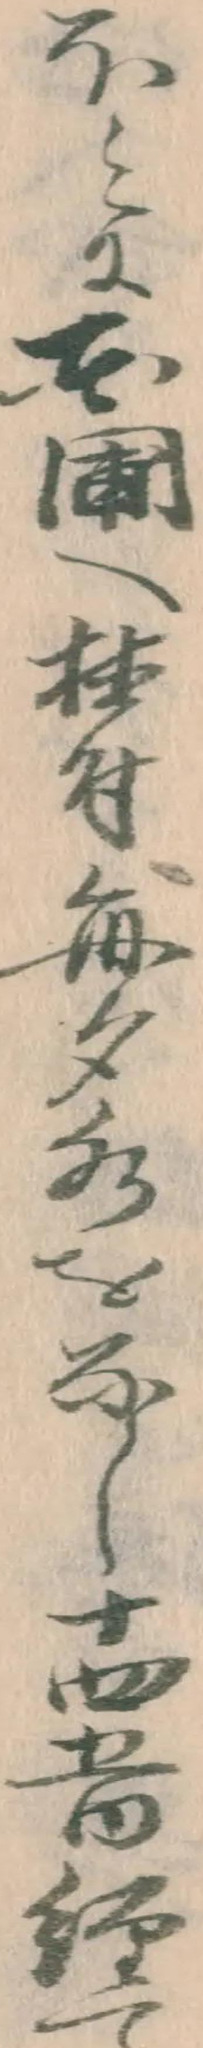ほとに花圃へ植付毎夕水をなし十四五日経て
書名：花菖培養録
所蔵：国立国会図書館 National Diet Library, JAPAN
